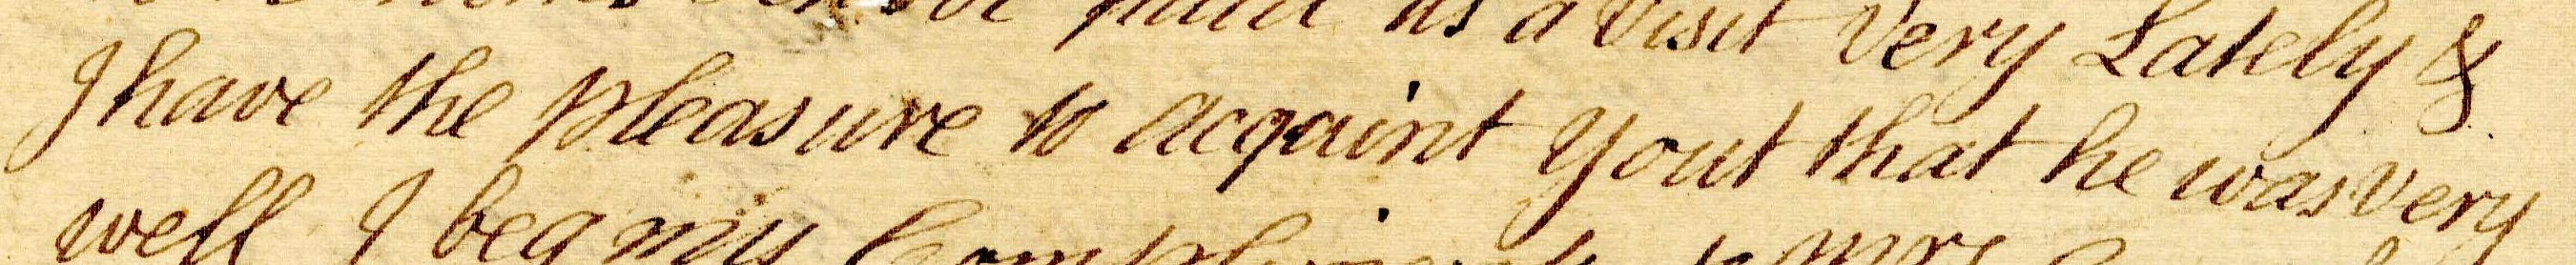I have the pleasure to acqaint You that he was Very
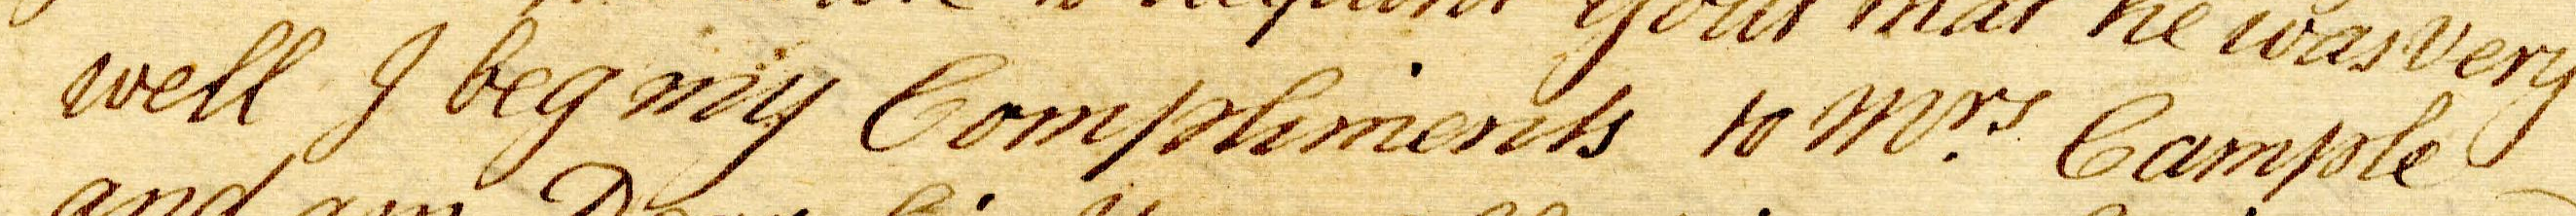well I beg my Compliments to M^rs. Cample
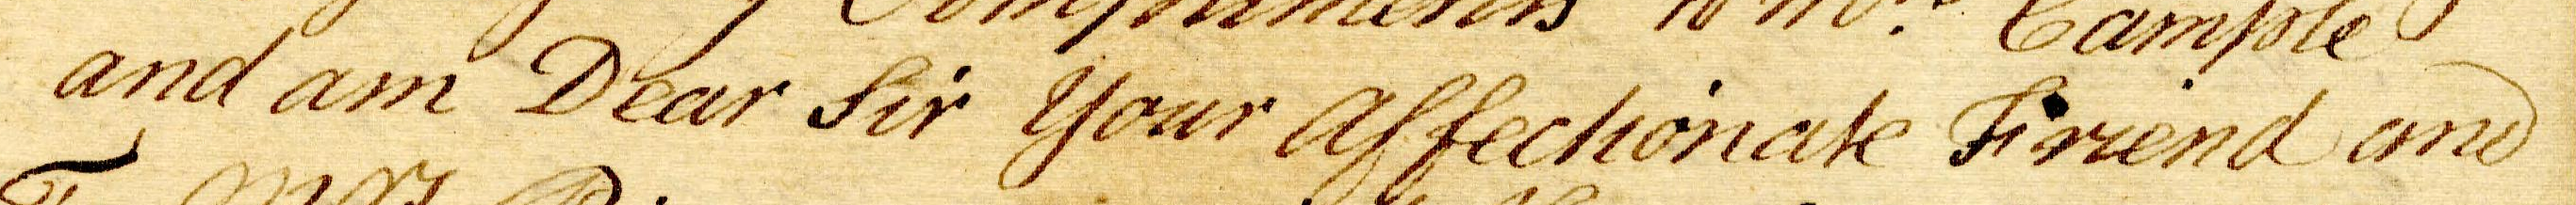and am Dear Sir Your Affectionate Friend and
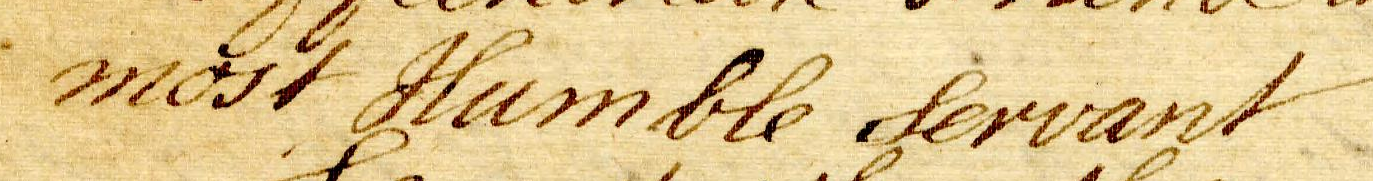most Humble Servant
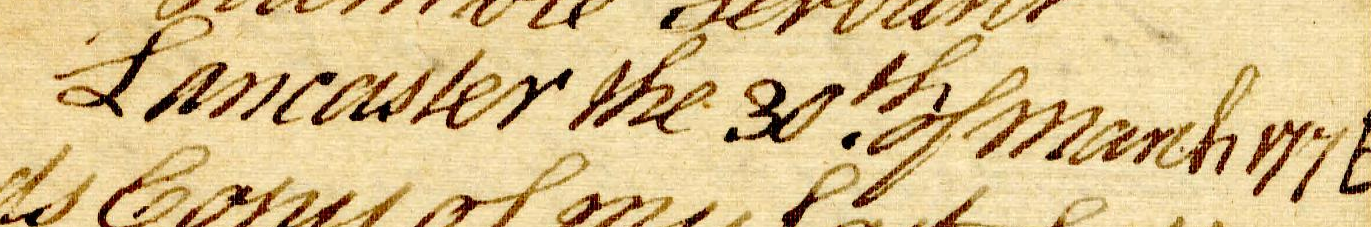Lancaster the 30^th. of March 1776
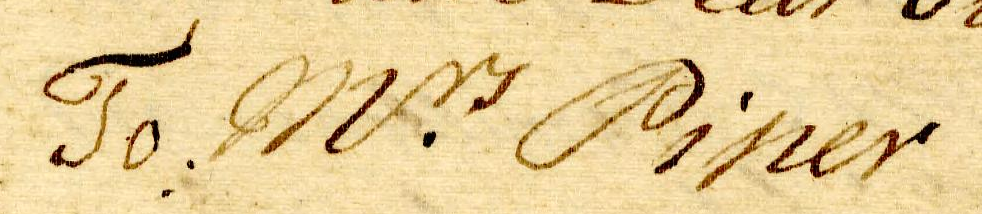To M^rs. Piper
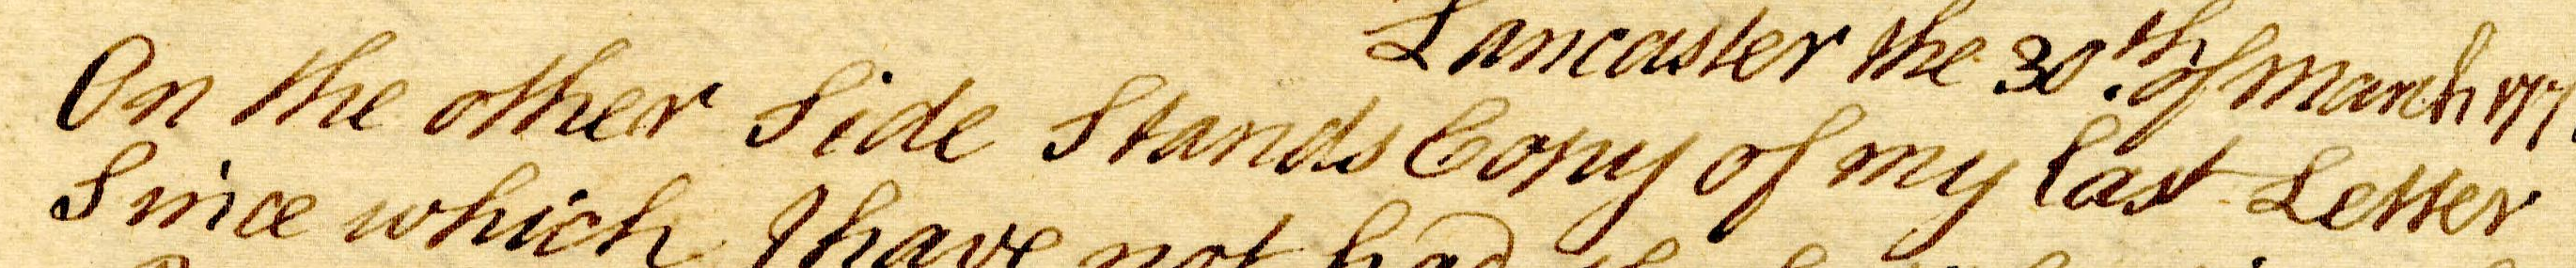On the other Side Stands Copy of my last Letter
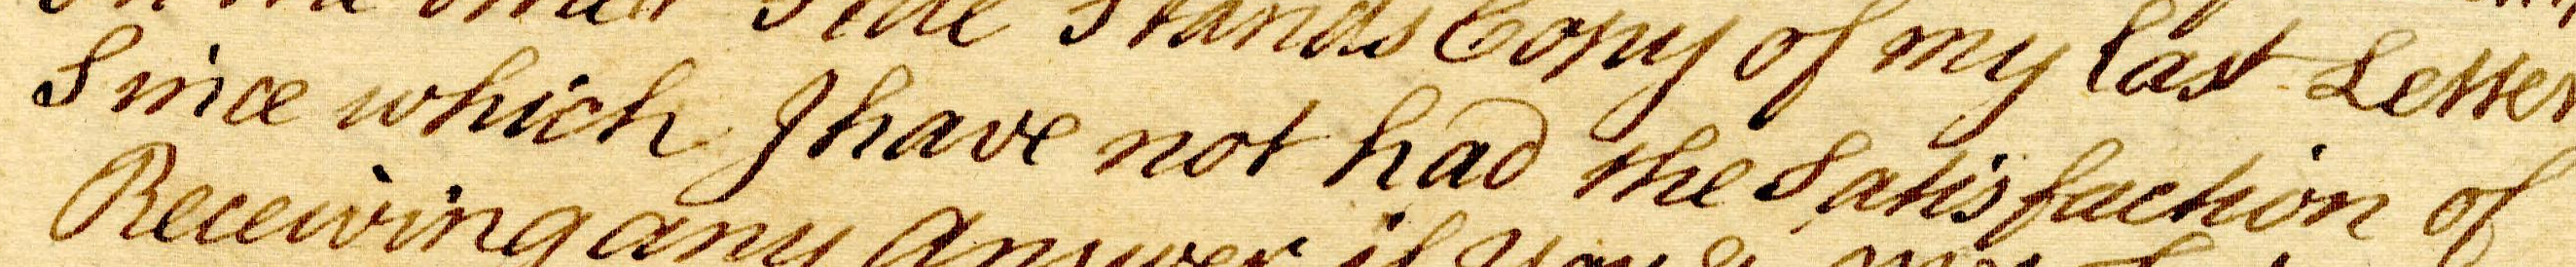Since which I have not had the Satisfaction of
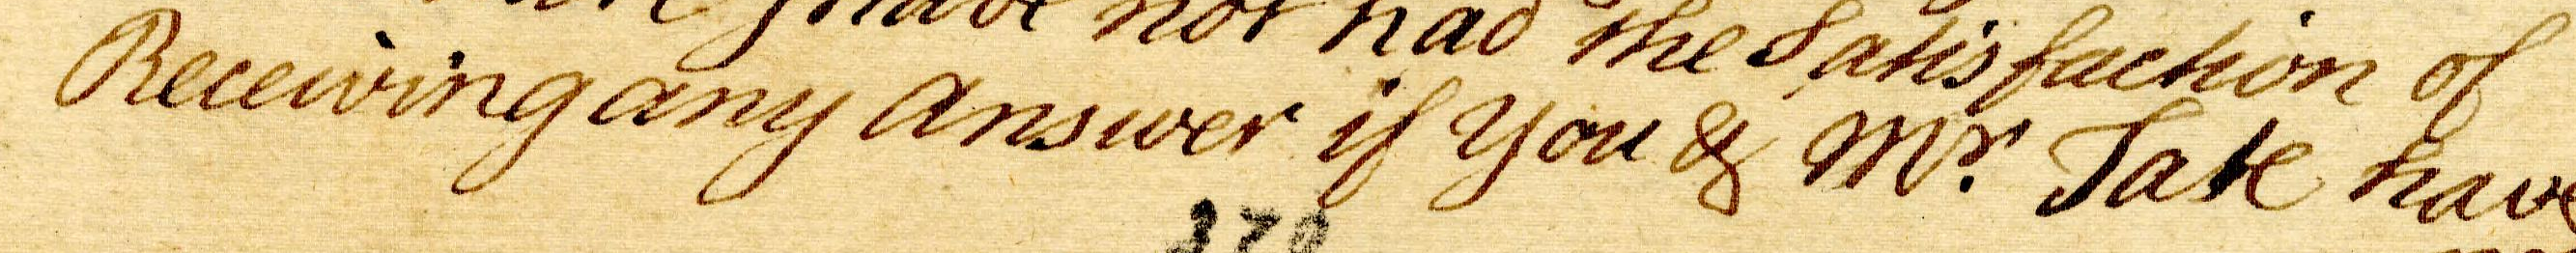Receiving any Answer if You & M^r. Tate have
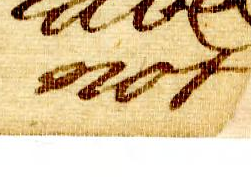not
